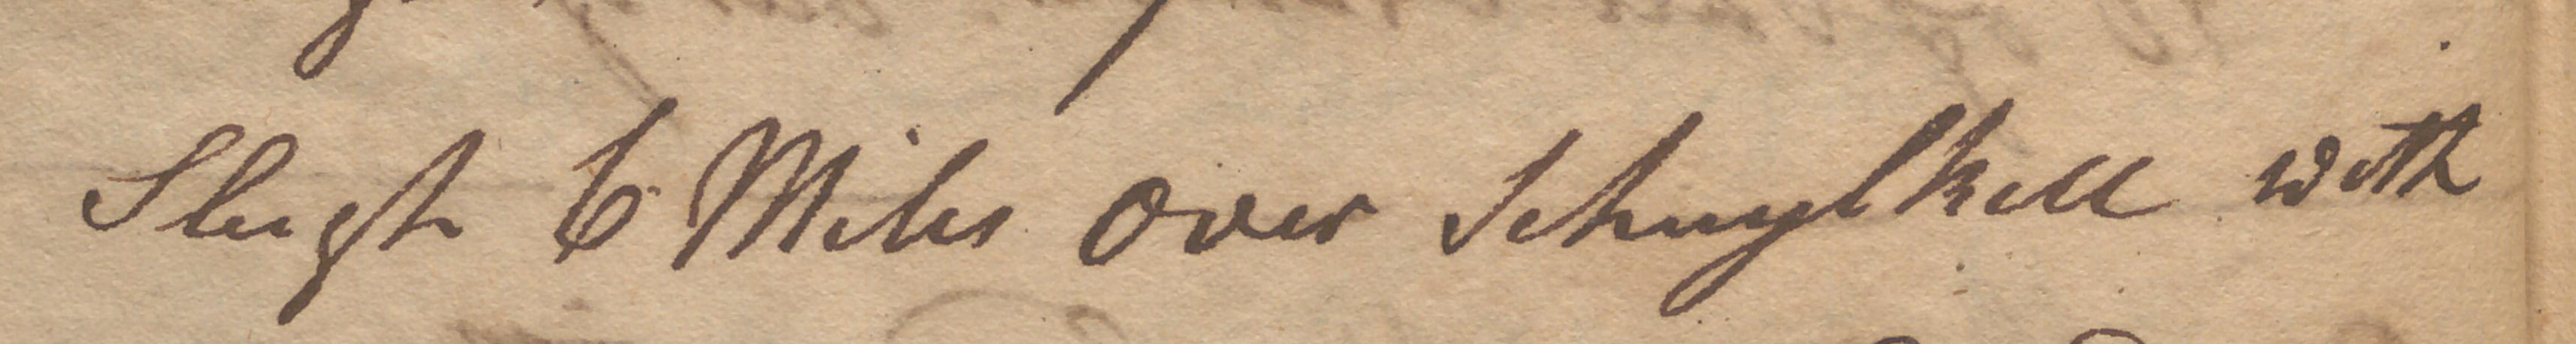Sleigh 6 Miles over Schuylkill with
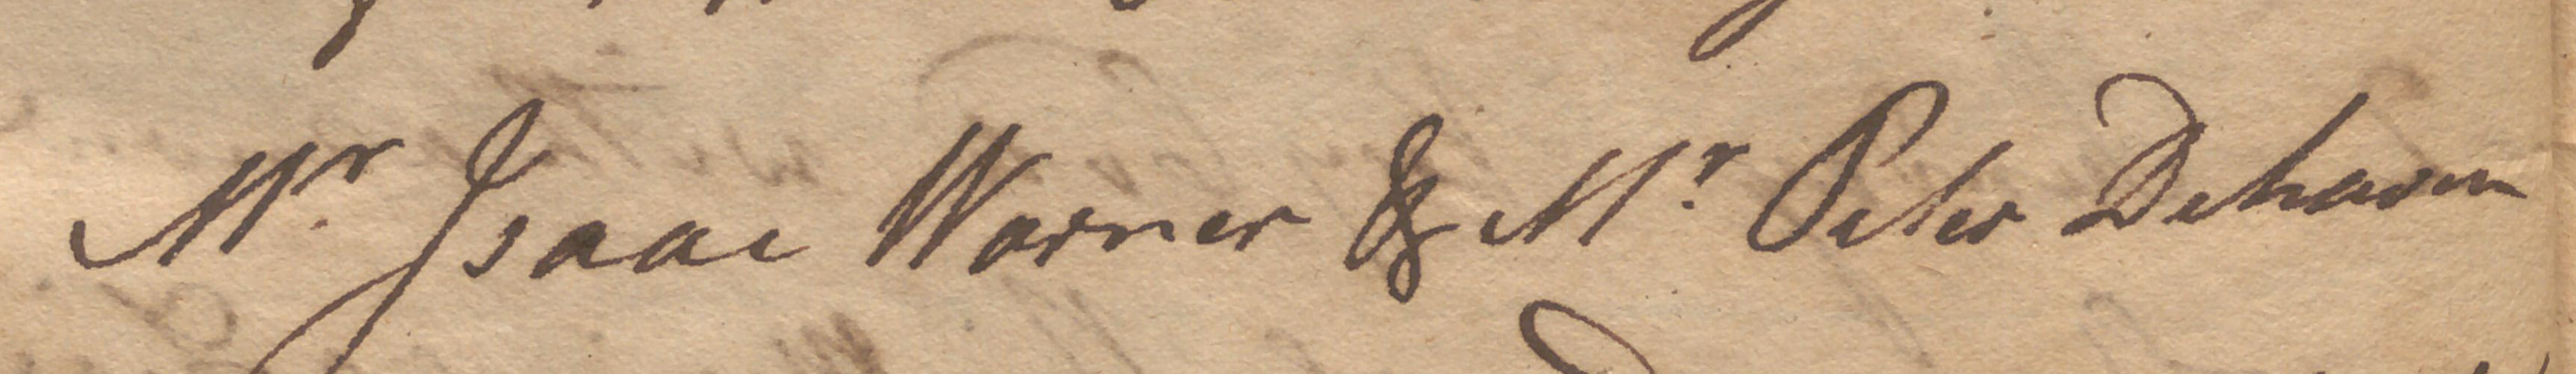M^r. Isaac Warner & M^r. Peter Dehavan
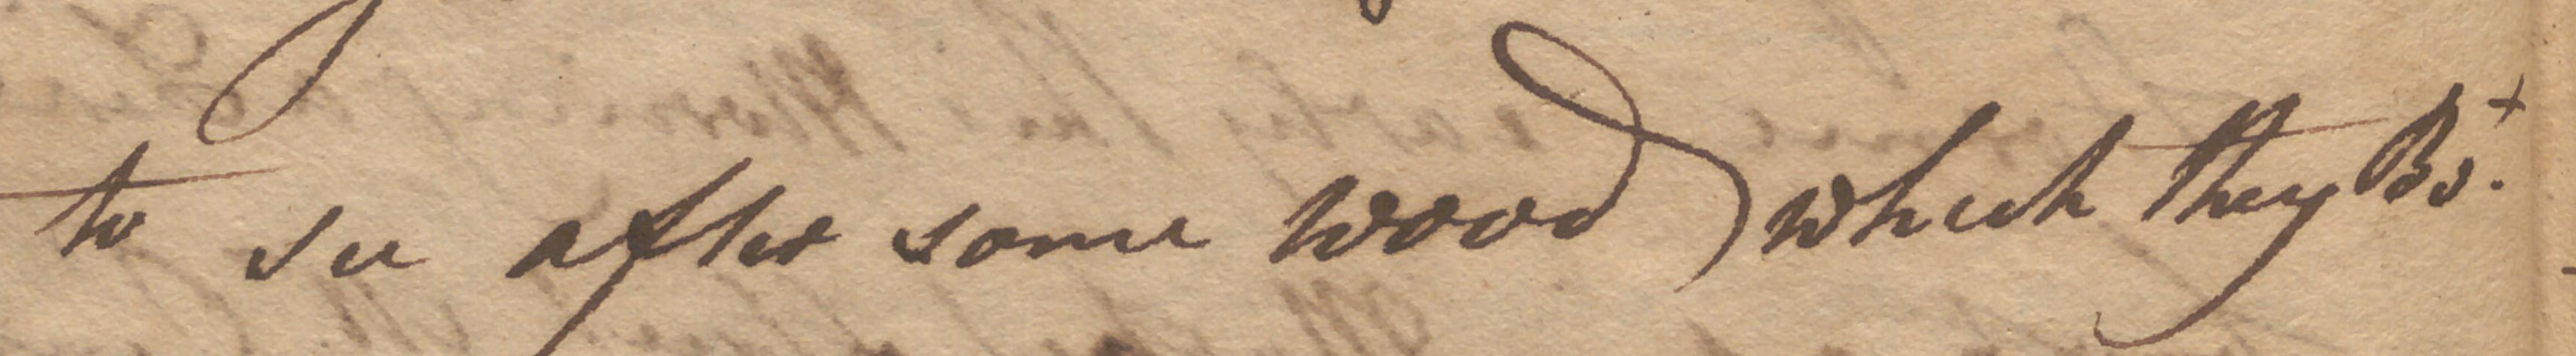to see after some wood which they Bo^t.
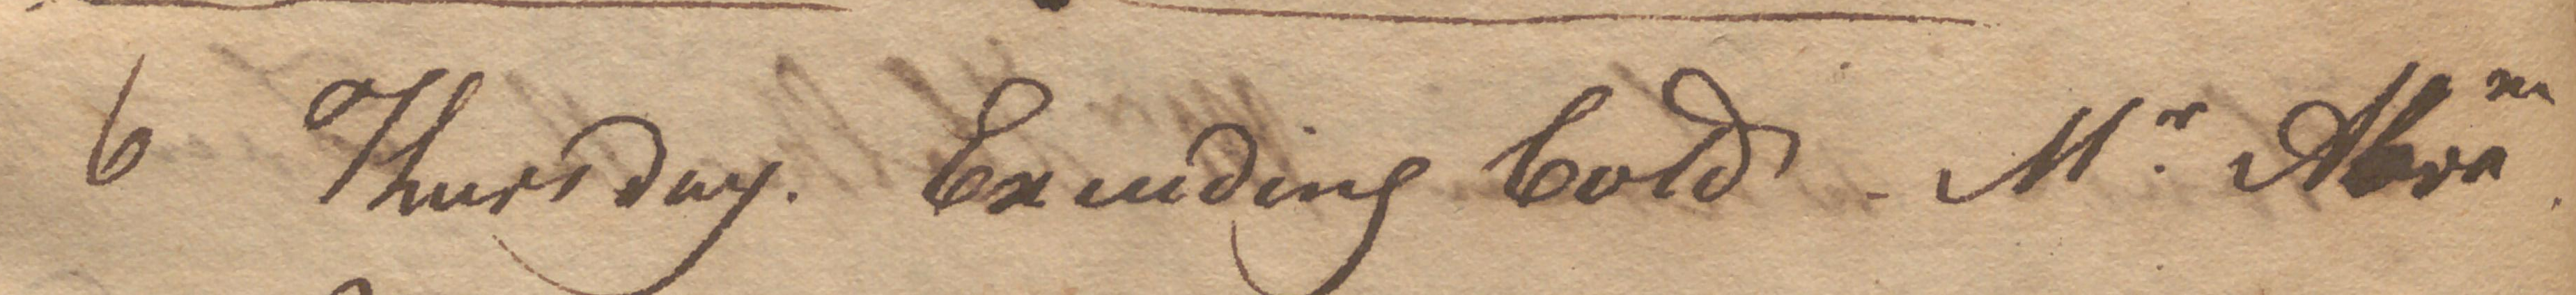6 Thursday. Exceeding Cold M^r. Abra^m.
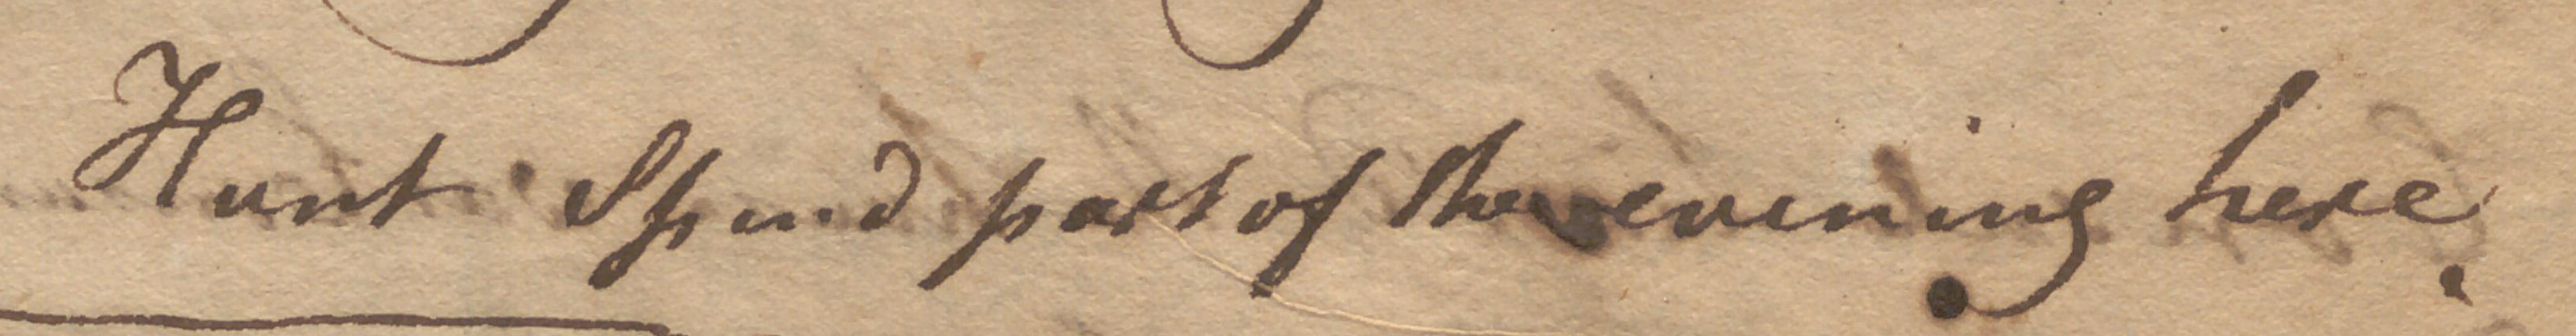Hunt spend part of the evening here
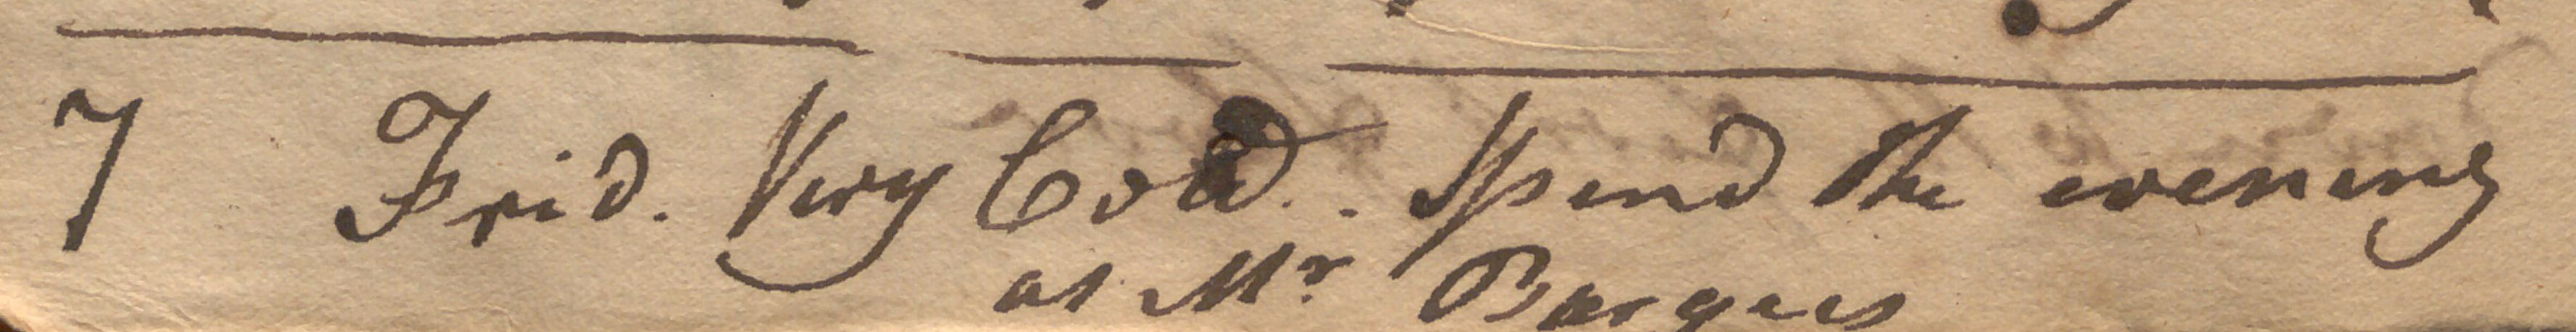7 Frid. Very Cold. spend the evening
